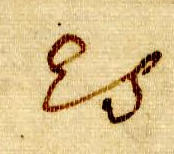ES
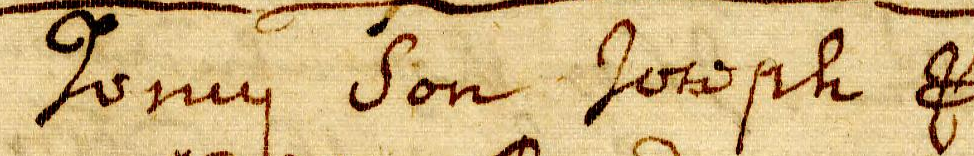To my Son Joseph per
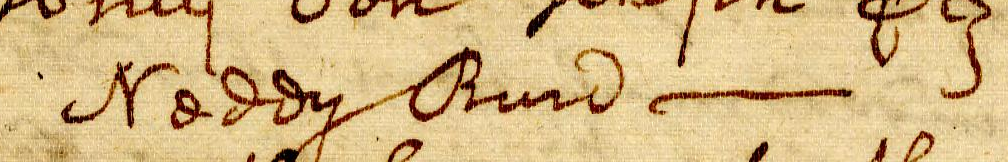Neddy Burd -
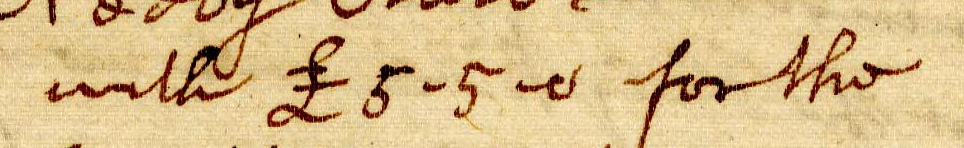with £5.5.0 for the
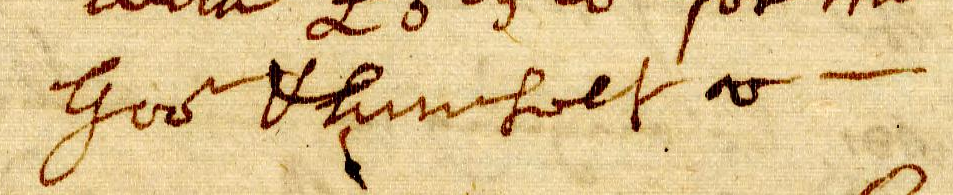Your Humble {_} -
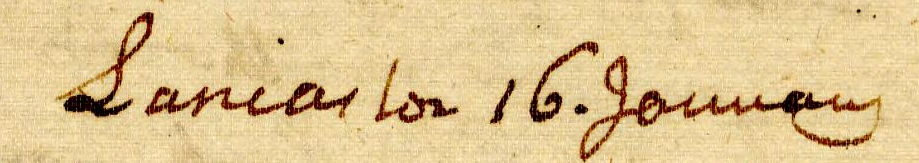Lancaster 16. January
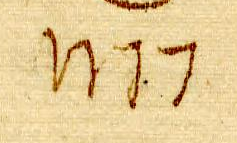1777
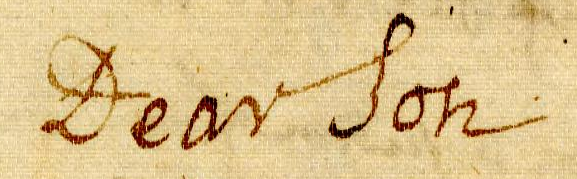Dear Son
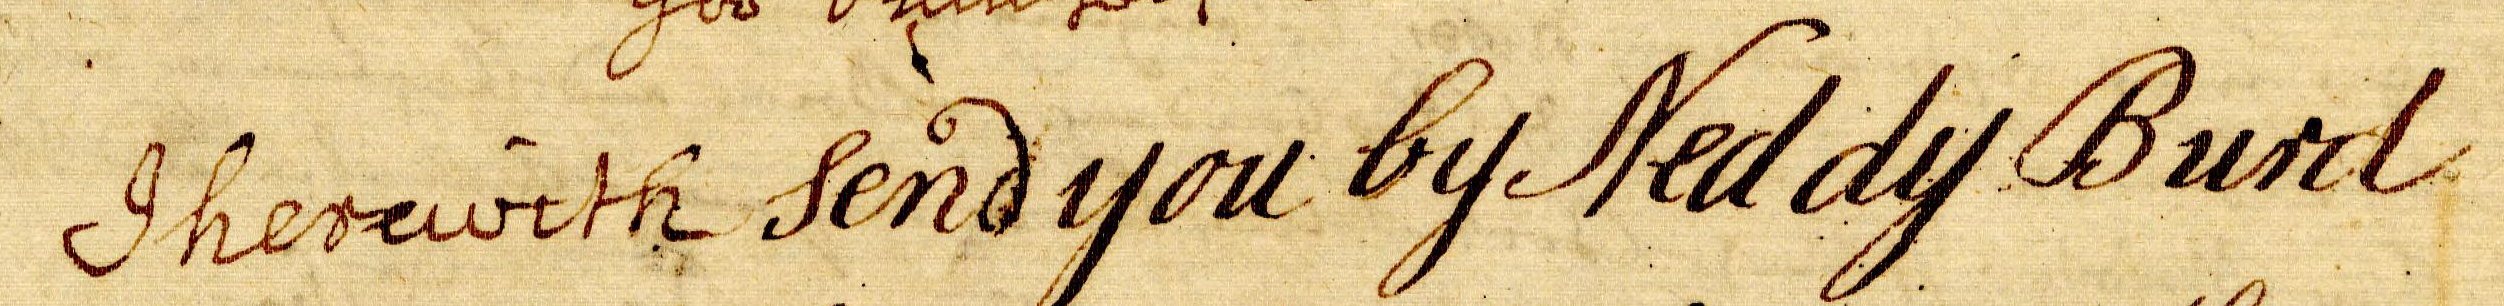I herewith send you by Neddy Burd
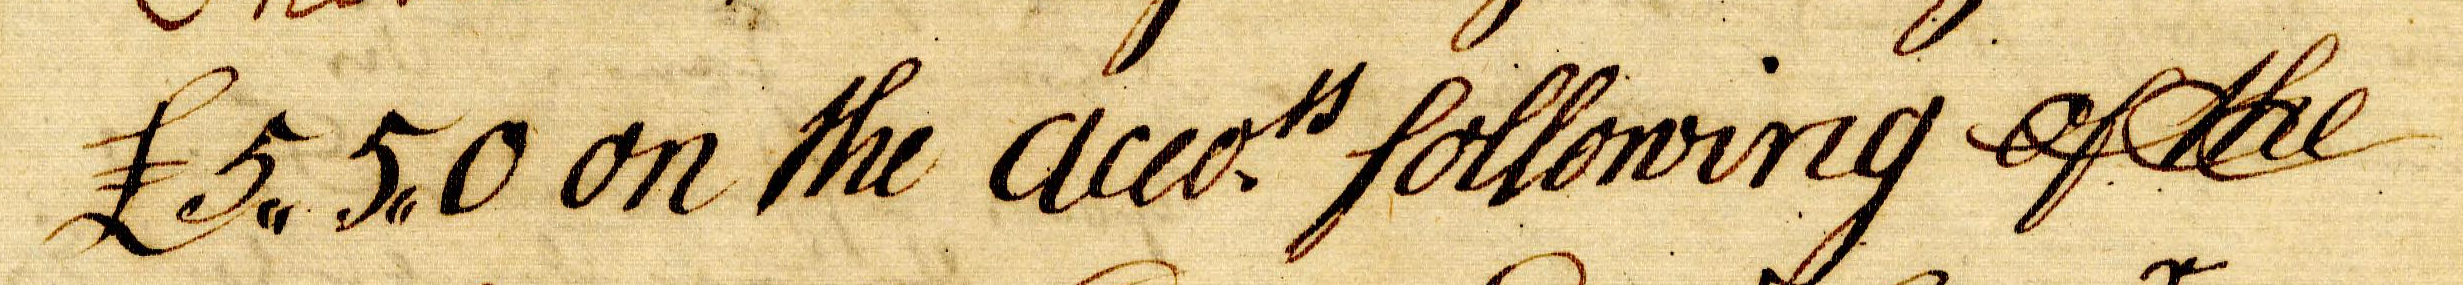£5..5..0 on the Acco^ts. following [of the]
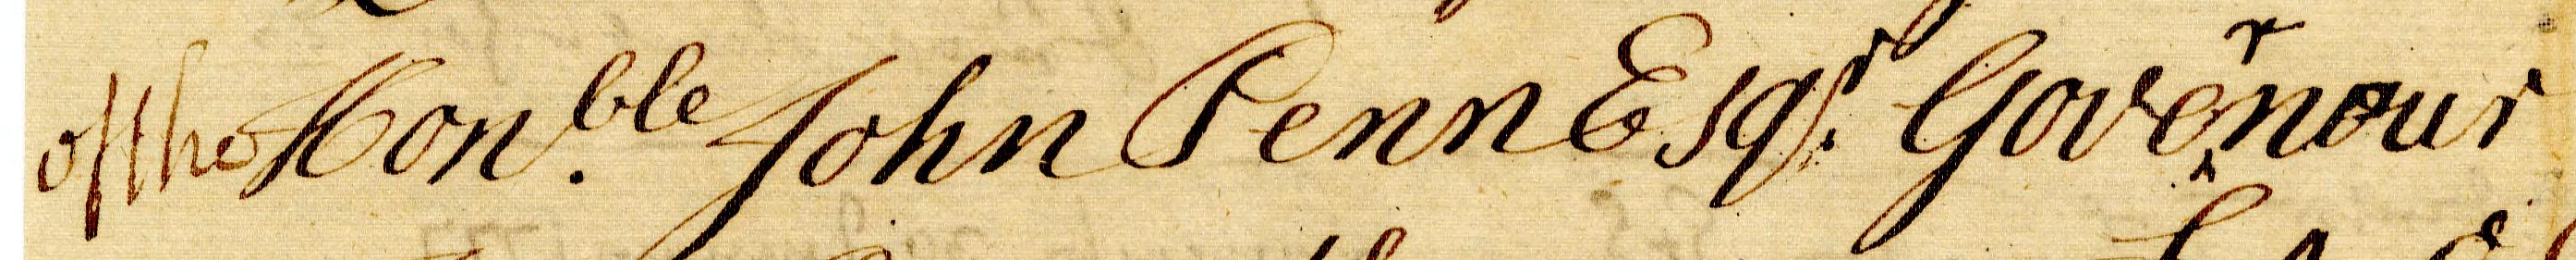of the Hon.^ble John Penn Esq^r. Gove^nour
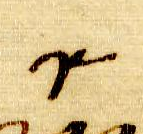r
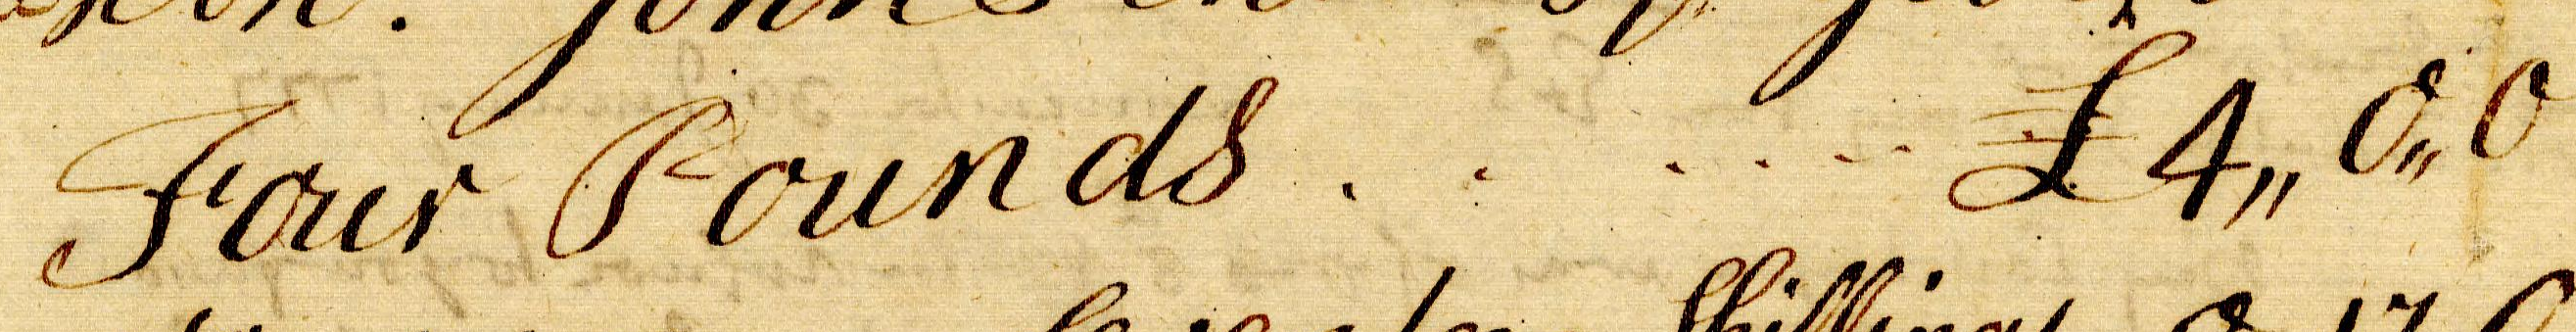Four Pounds ...... £4..0..0
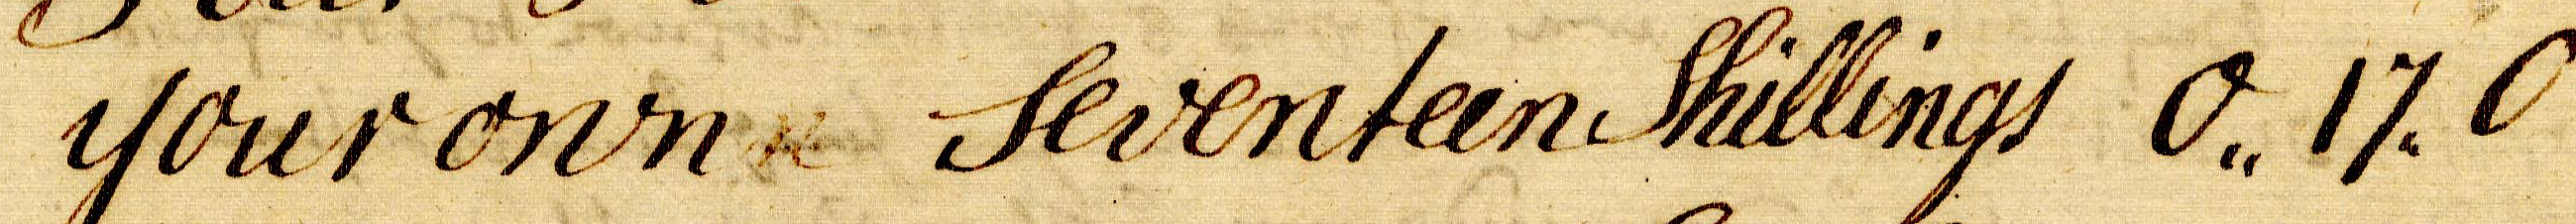Your own seventeen Shillings 0..17..0
